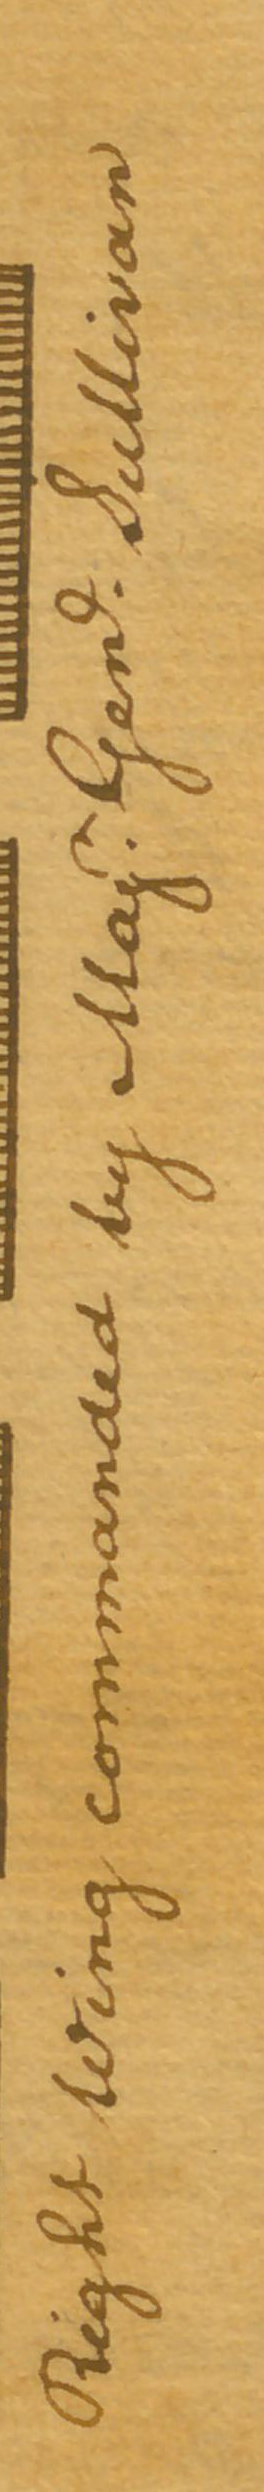Right Wing commanded by Maj^r. Gen^l. Sullivan
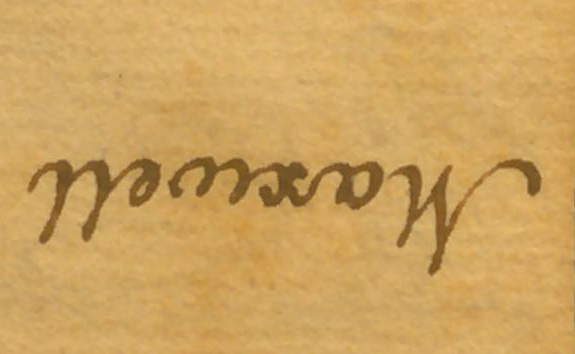Maxwell
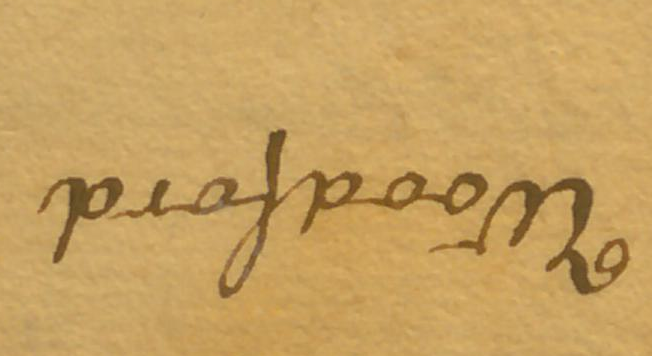Woodford
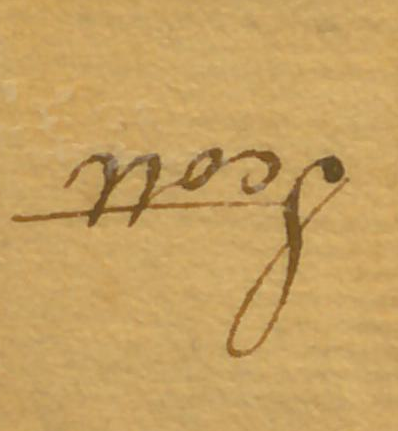Scott
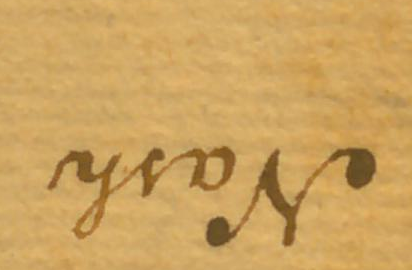Nash
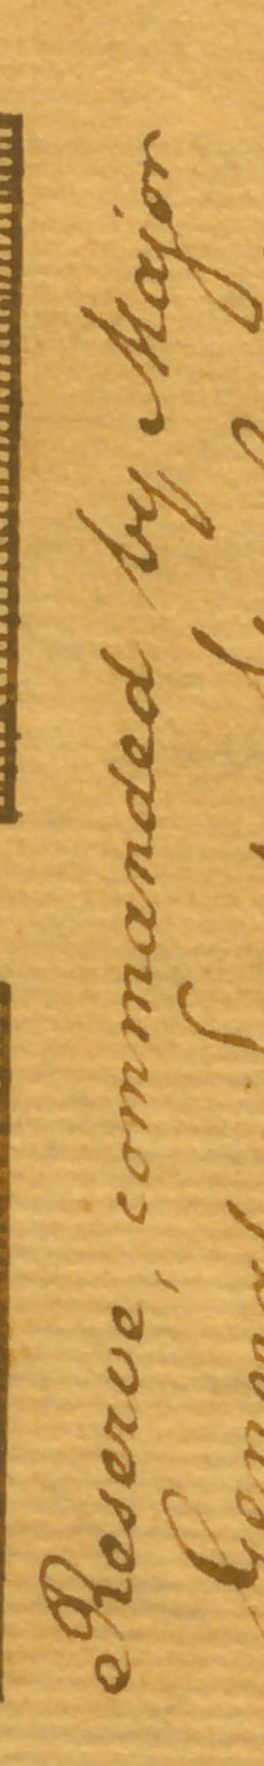Reserve, commanded by Major
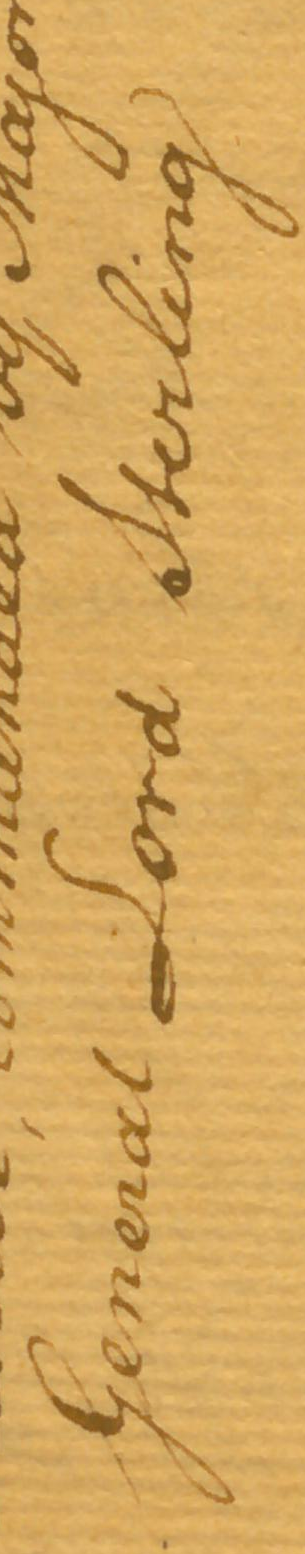General Lord Sterling
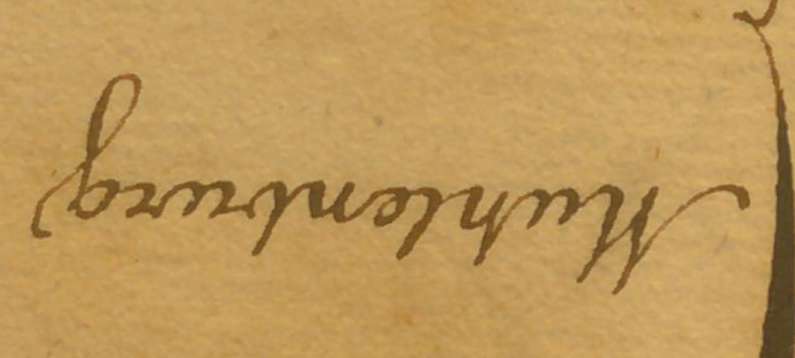Muhlenburg
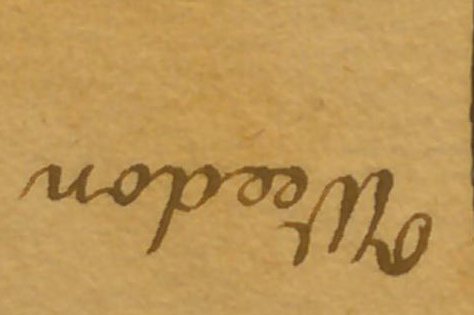Weedon
